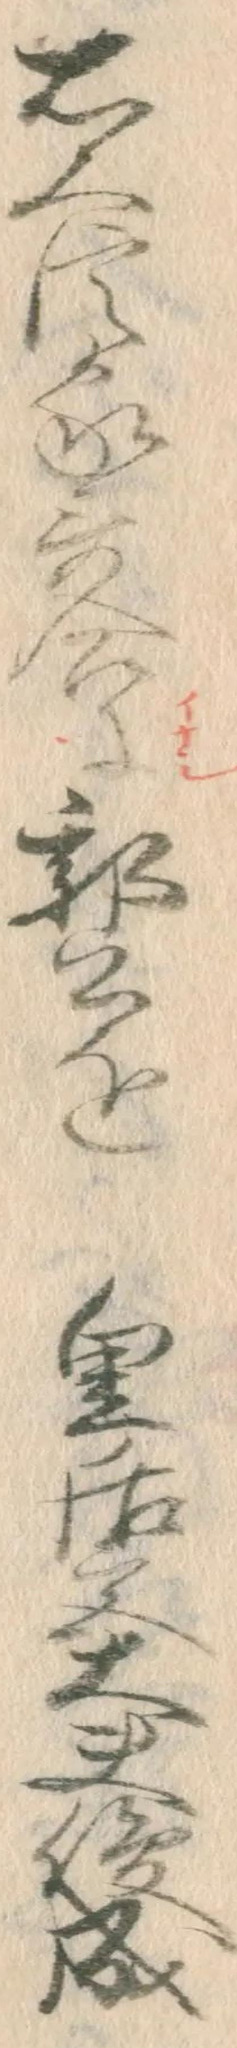右大臣家歌合に郭公を皇后宮大夫俊成
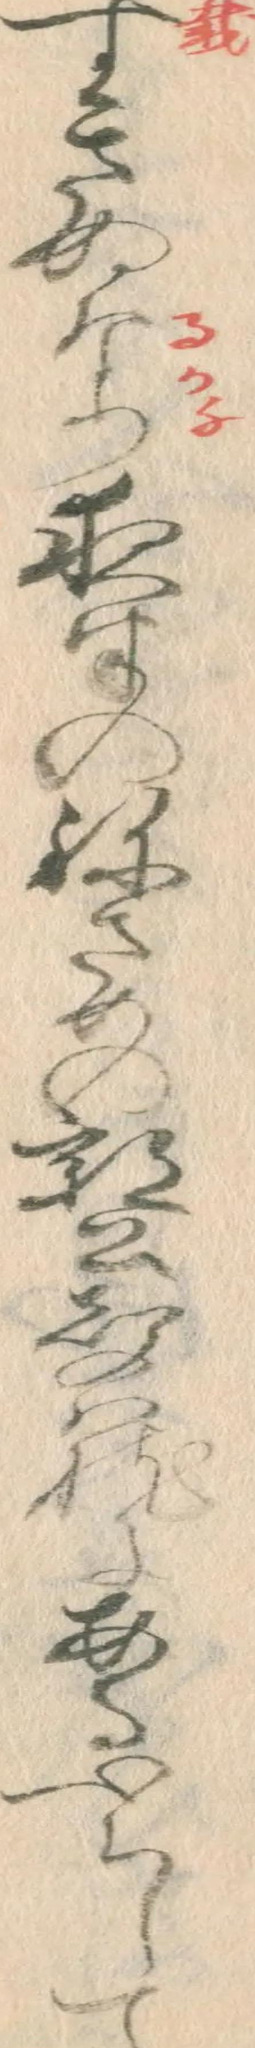すきぬなり夜半のねさめの郭公声は枕にある心ちして
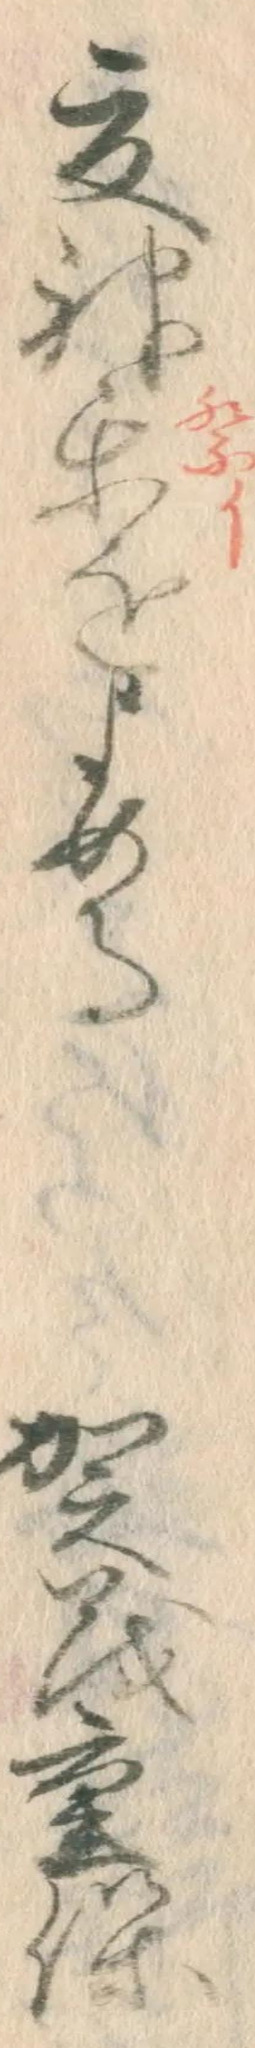夏神楽をよめる賀茂重保

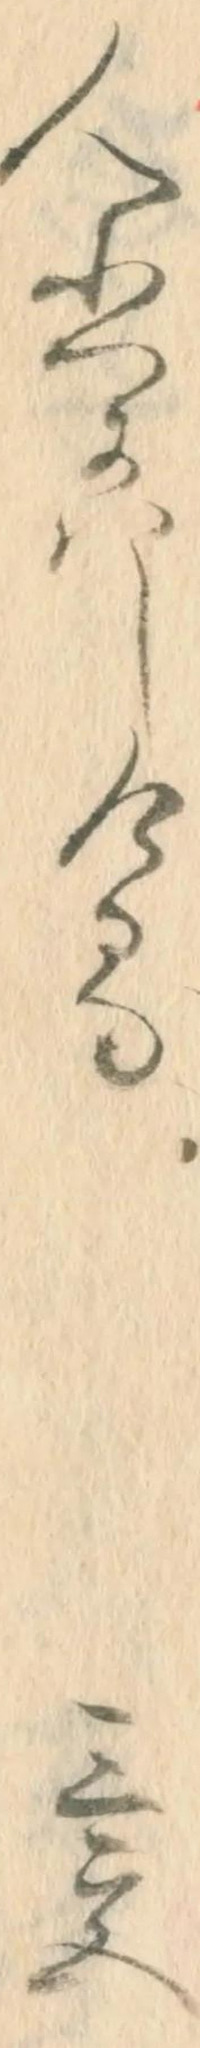人につかはしける三宮
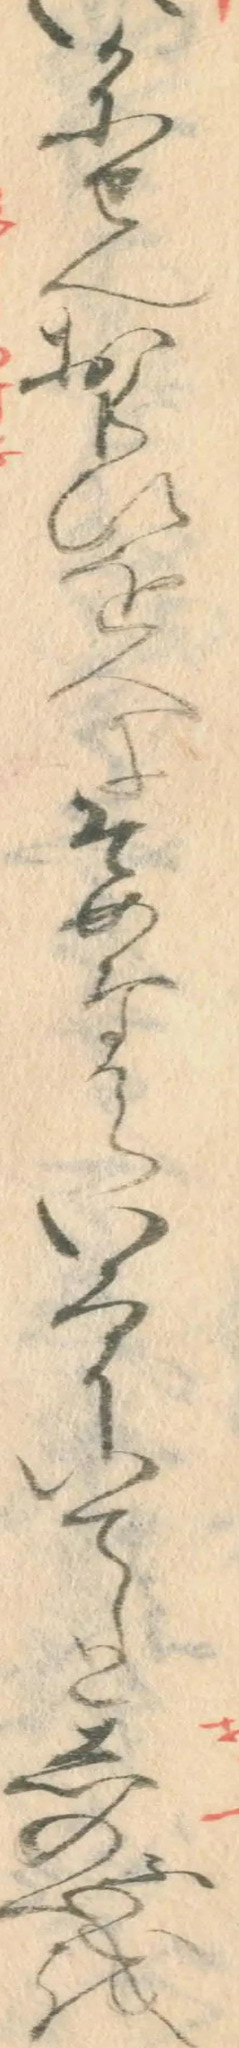いかにせんおもひを人にそめなからいろにいてしとしのふ心を
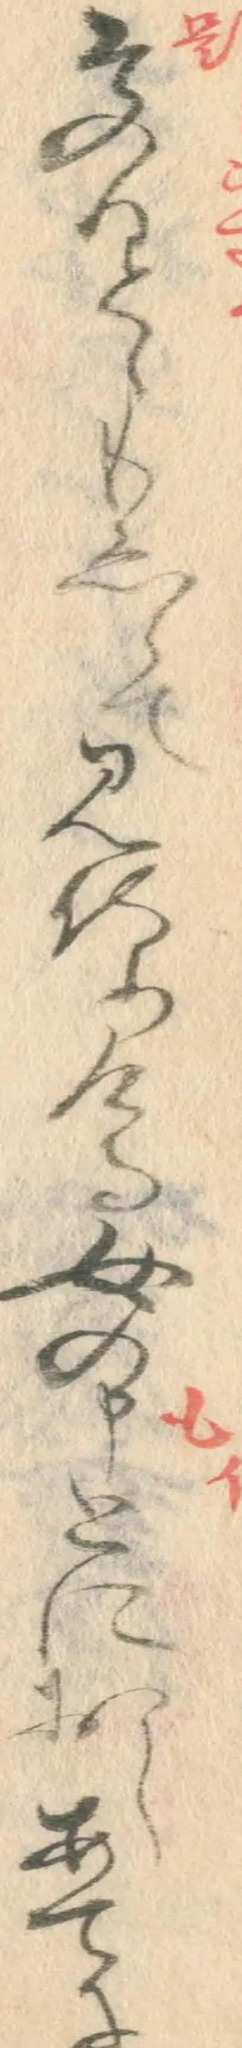そのひとゝもしらて見侍りける女の申とにおしあてに
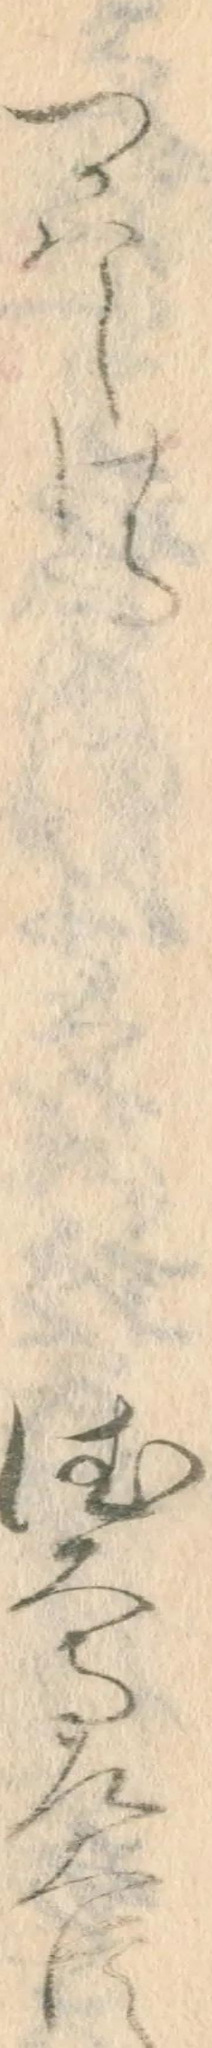つかはしける徳大寺左大臣
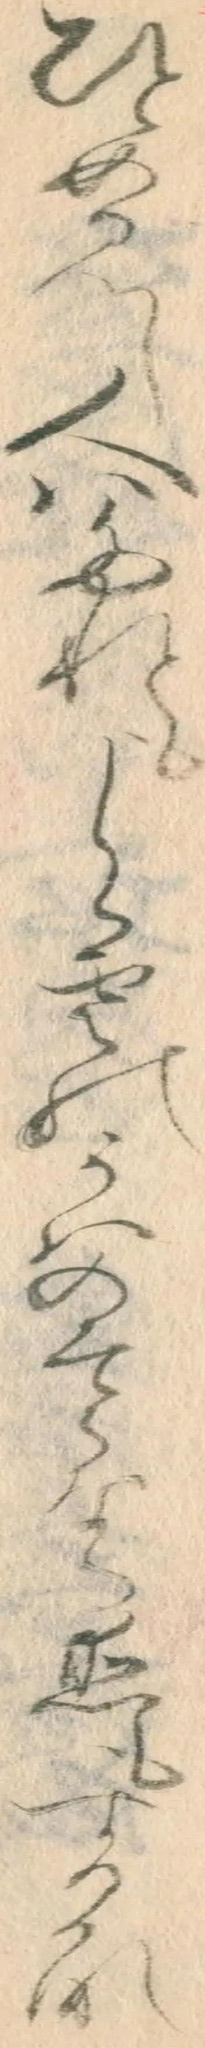ひとめ見し人はたれともしら雲のうはのそらなる恋もするかな
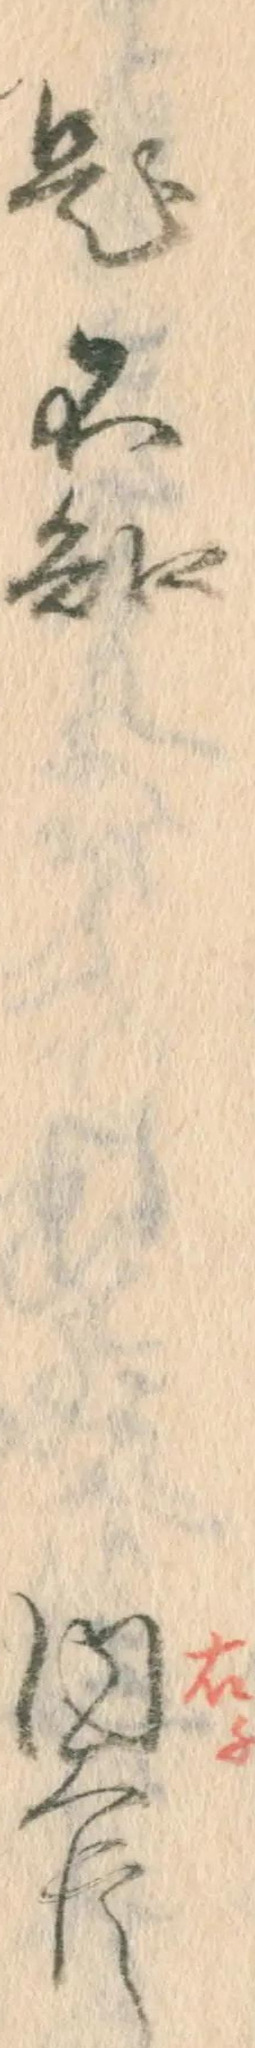題不知内大臣
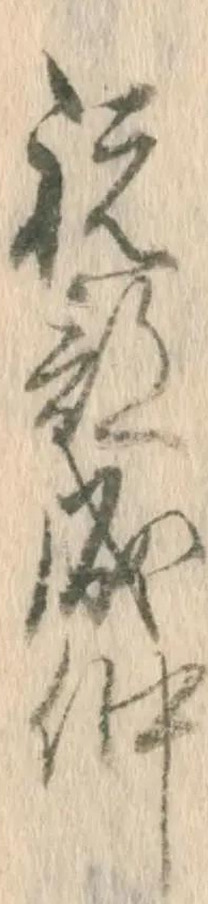祝部成仲
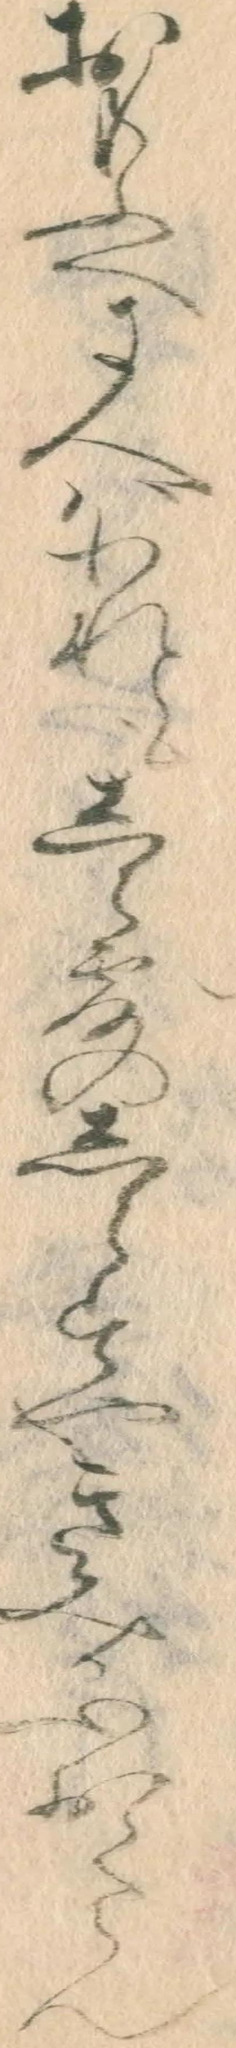おもふへき人はわれともしら露のしらすやきみか心おくらん
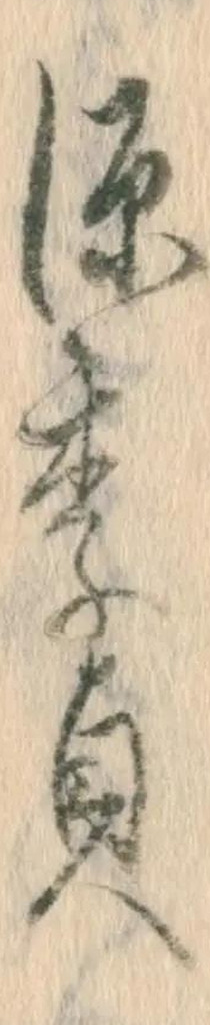源季貞
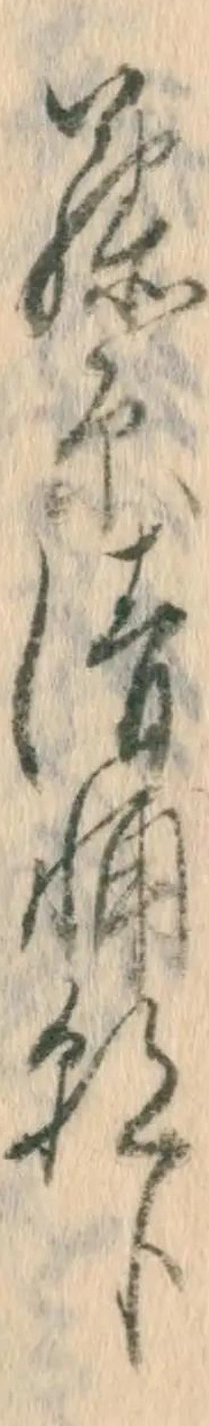藤原清輔朝臣
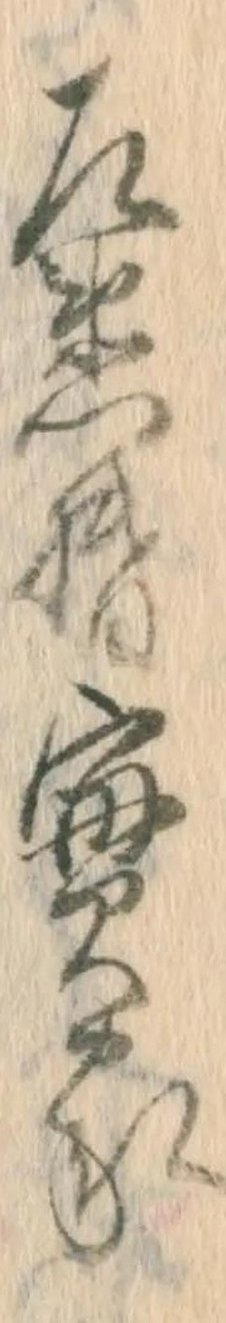左衛督実義
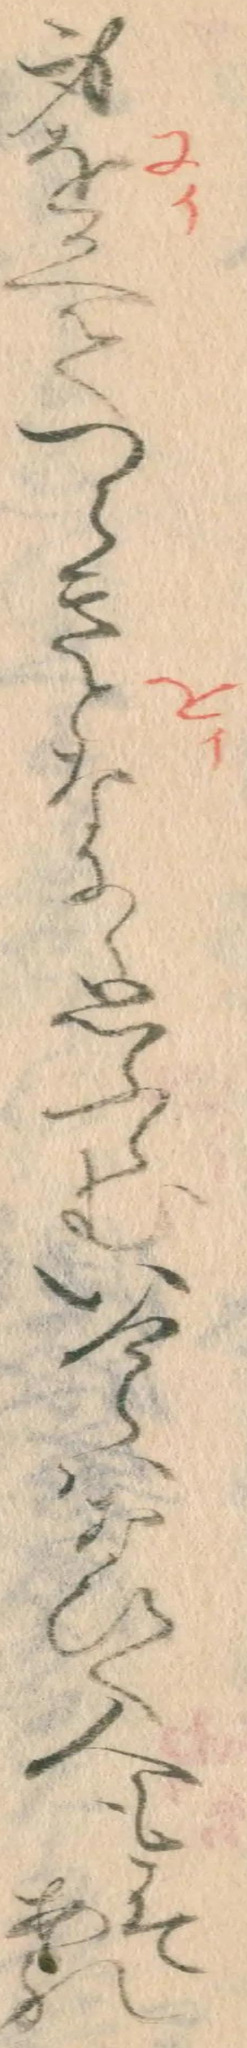身をかへてつらきとなにゝ思ふらむいけらはなひく人もこそあれ
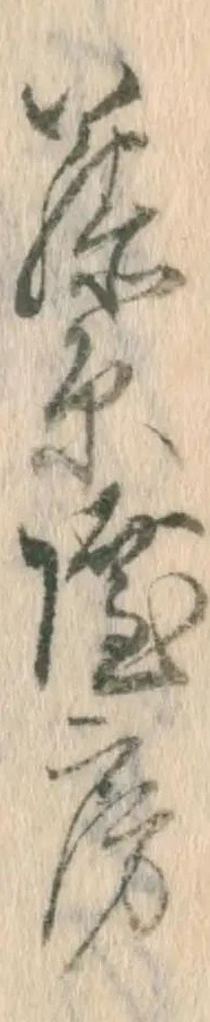藤原隆房
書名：月詣和歌集
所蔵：国立国会図書館 National Diet Library, JAPAN
